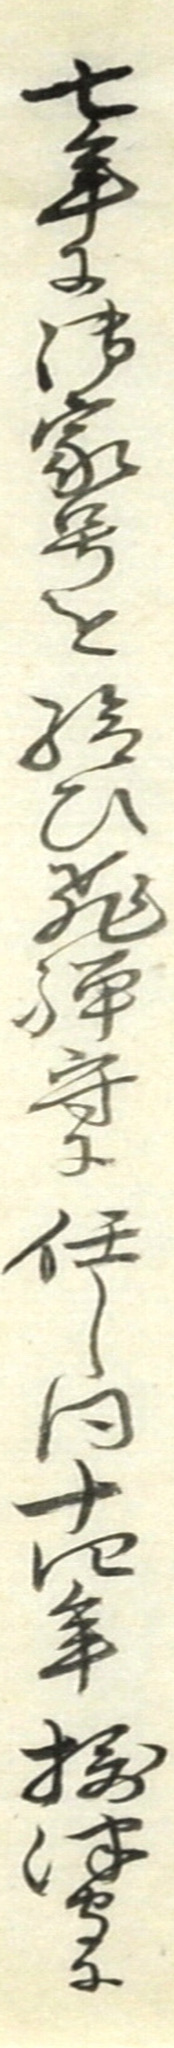七年に御家号を給ひ飛騨守に任し同十四年摂津守に
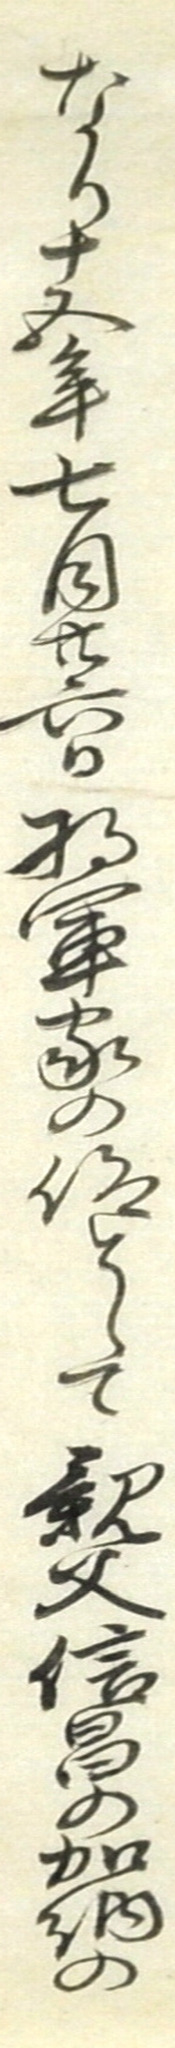なり十五年七月廿六日将軍家の仰として親父信昌の加納の
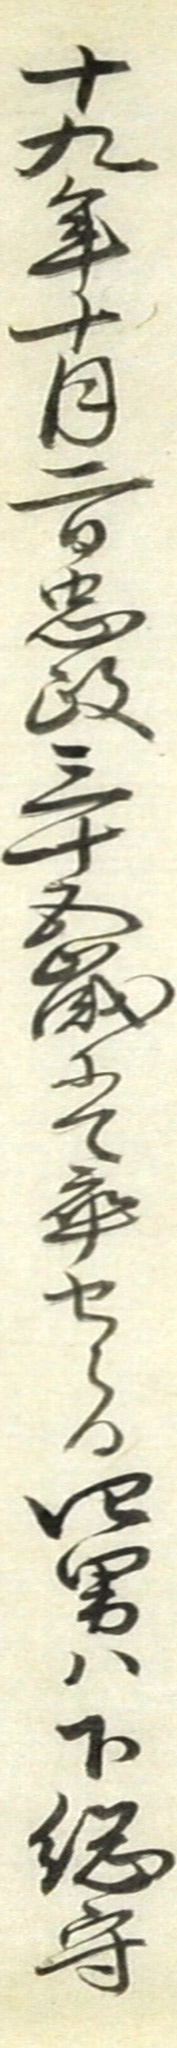十九年十月二日忠政三十五歳にて卒せらる四男は下総守
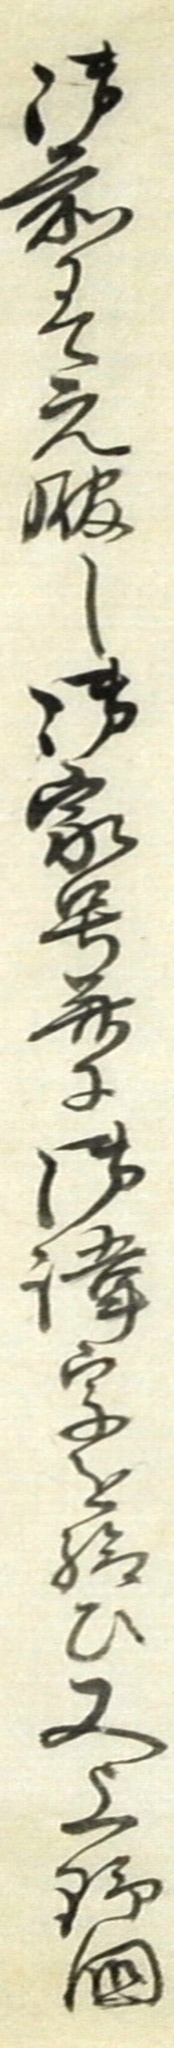御前にて元服し御家号幷に御諱字を給ひ又上野国
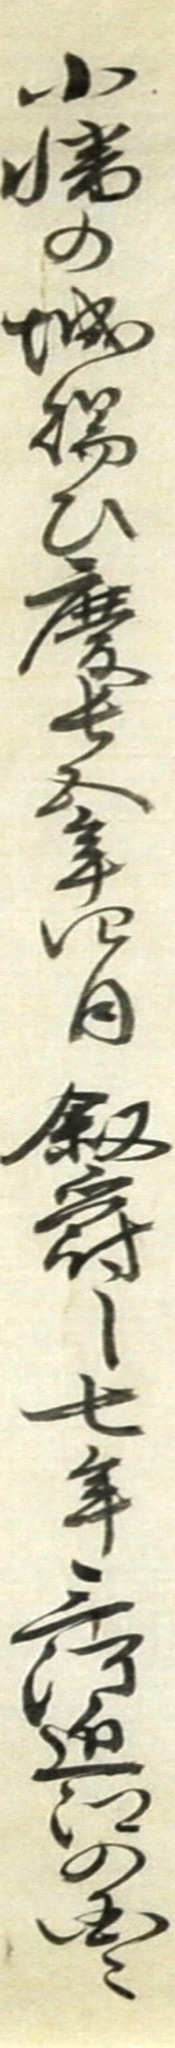小幡の城賜ひ慶長五年四月叙爵し七年三河近江の国々
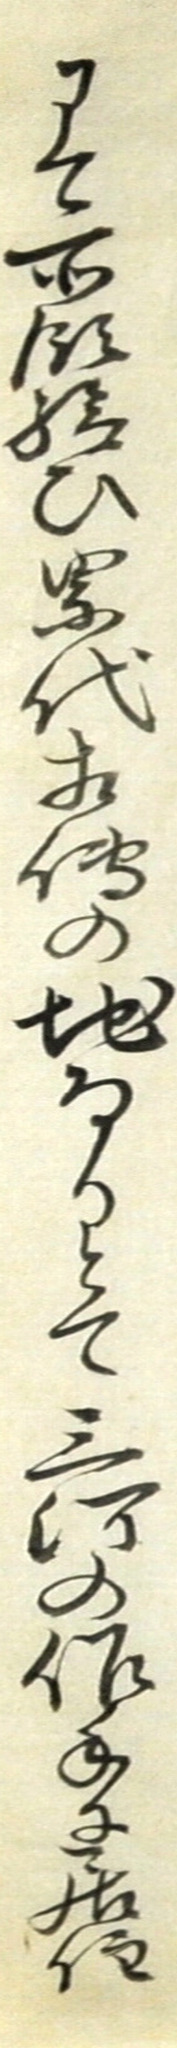にて所領給ひ累代相伝の地なりとて三河の作手に居住
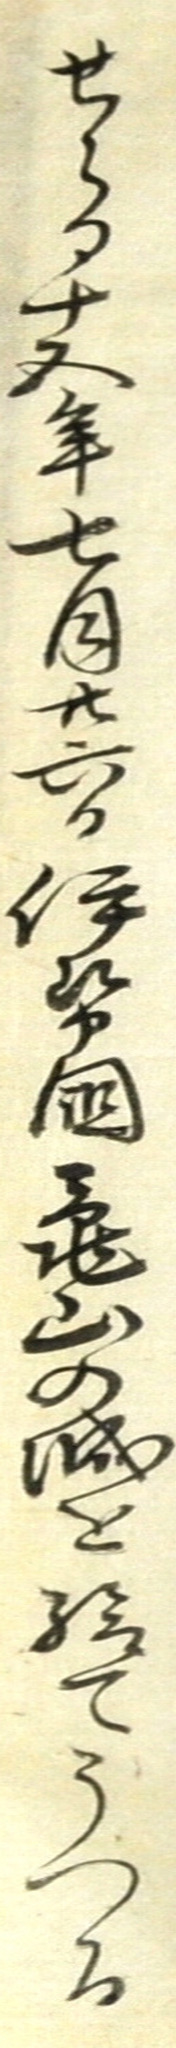せらる十五年七月廿六日伊勢国亀山の城を給てうつる

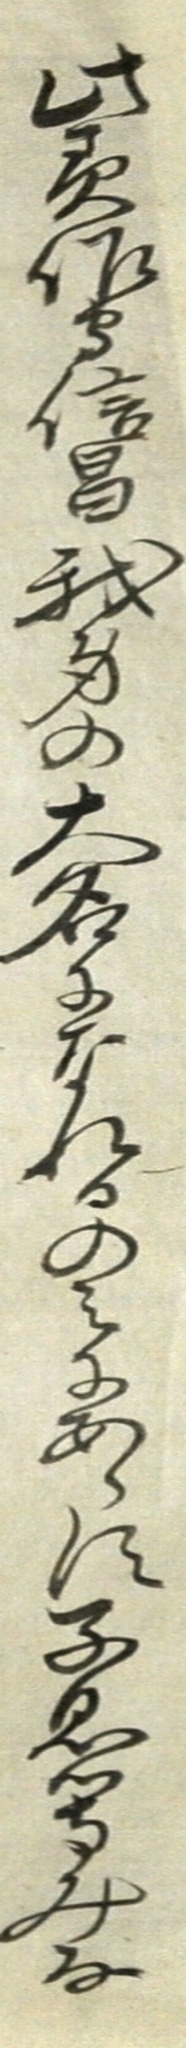此美作守信昌我身の大名になれるのみにあらす子息等みな
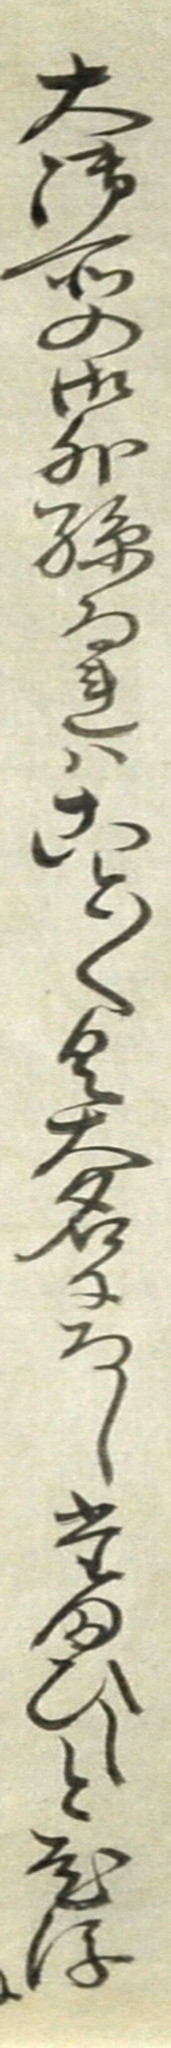大御所の御外孫なれはこと〳〵く大名になしたまひしと老後に
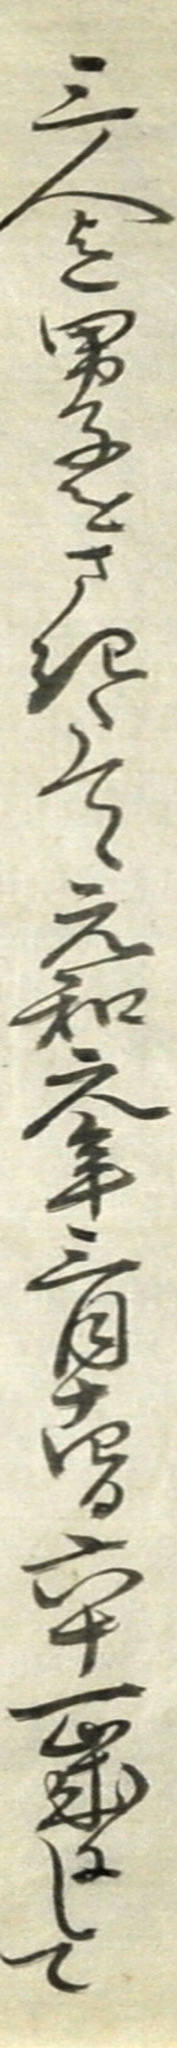三人迄男子をさきたてゝ元和元年三月十四日六十一歳にして
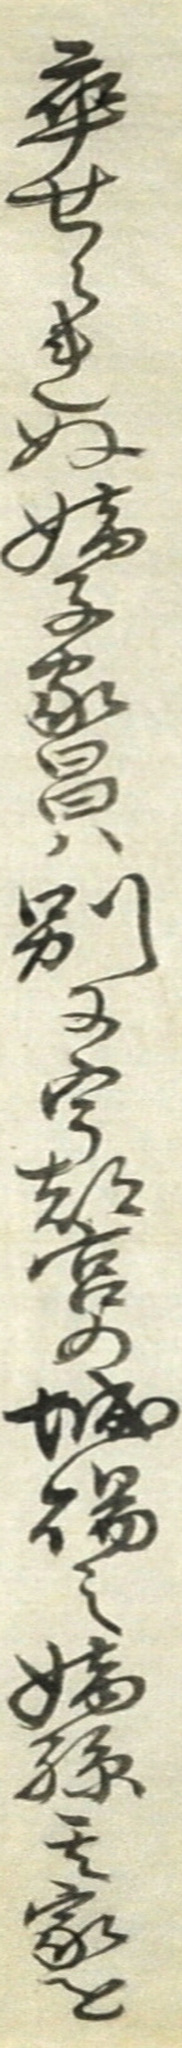卒せられぬ嫡子家昌は別に宇都宮の城賜し嫡孫其家を
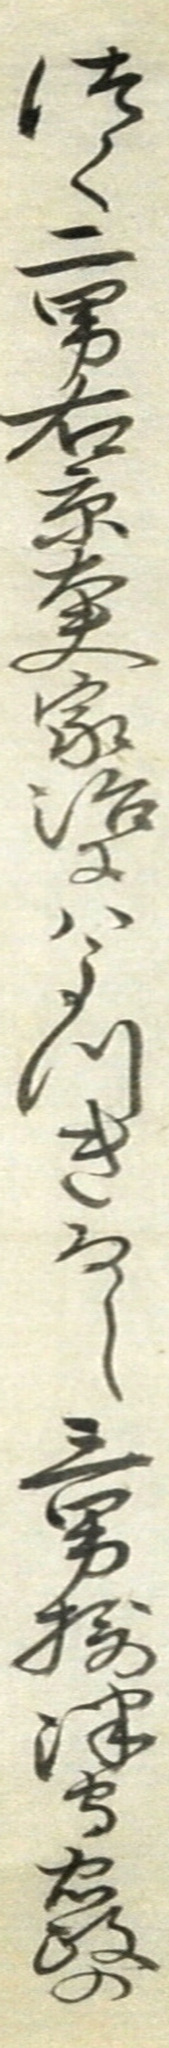つく二男右京大夫家治にはよつきなし三男摂津守忠政の
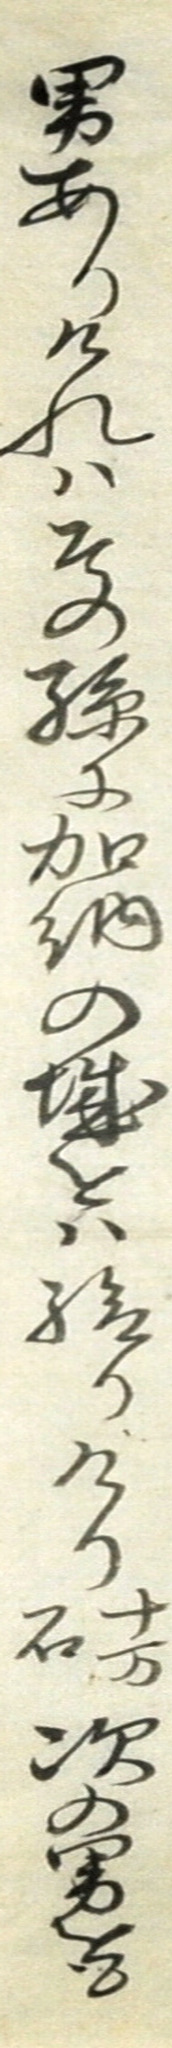男ありけれはその孫に加納の城をは給りけり十万石次の男をも
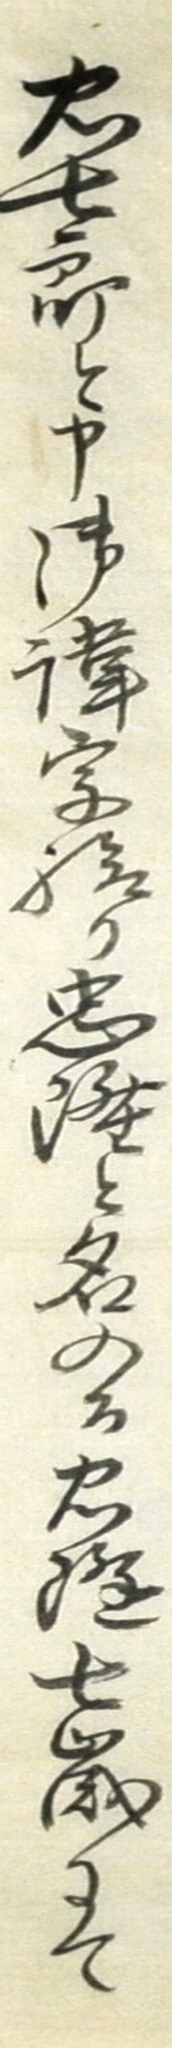忠七郎と申御諱字給り忠隆と名のる忠隆七歳にて
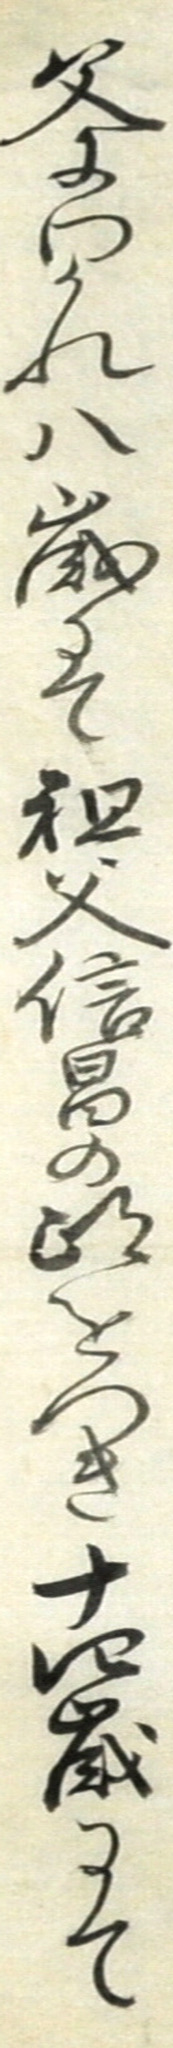父にわかれ八歳にて祖父信昌の政をつき十四歳にて
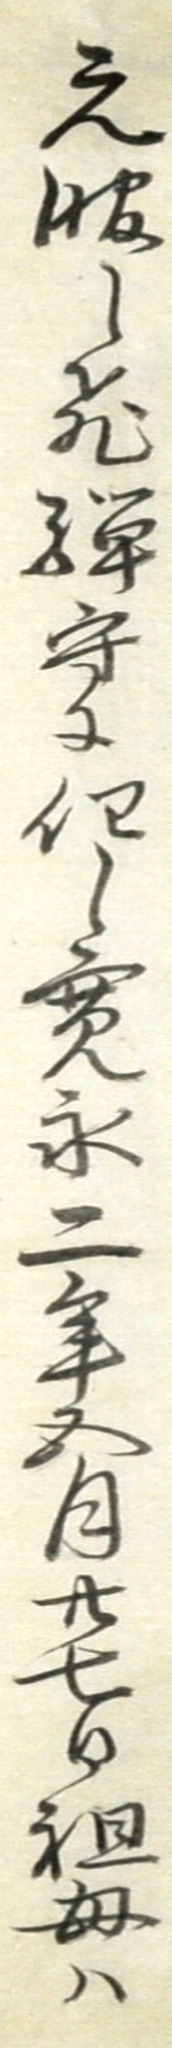元服し飛騨守に任し寛永二年五月廿七日祖母は
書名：藩翰譜（六）
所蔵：伊那市立高遠町図書館・合同会社AMANE
